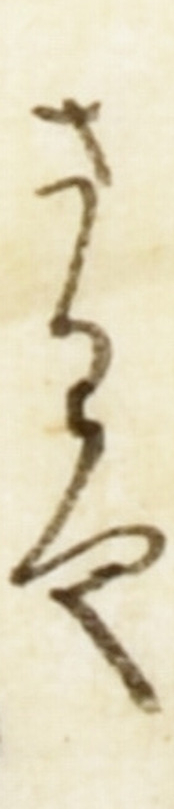さわや
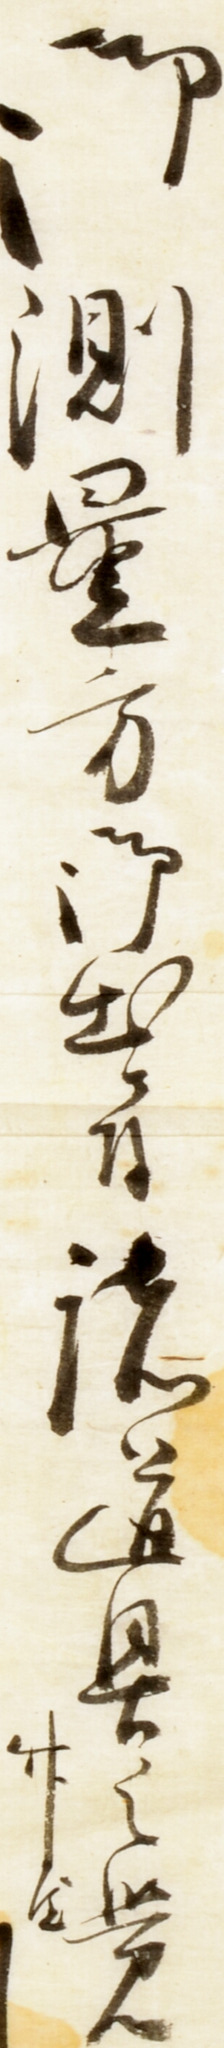御測量方御出ニ付諸道具之覚

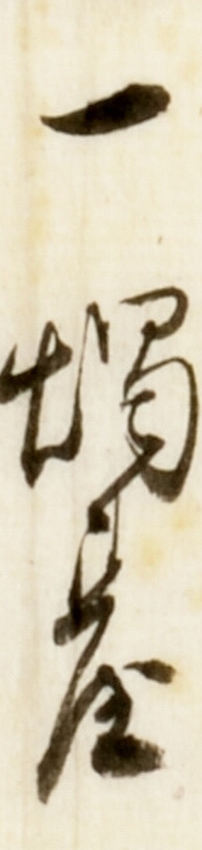一燭台
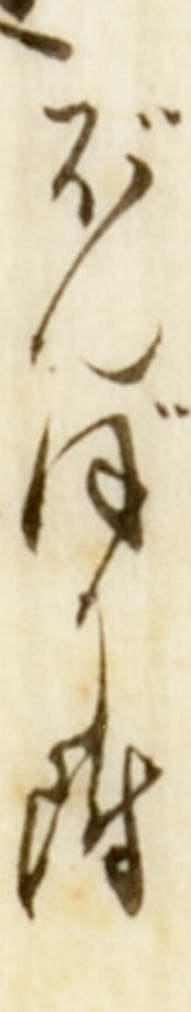ぼんぼり附
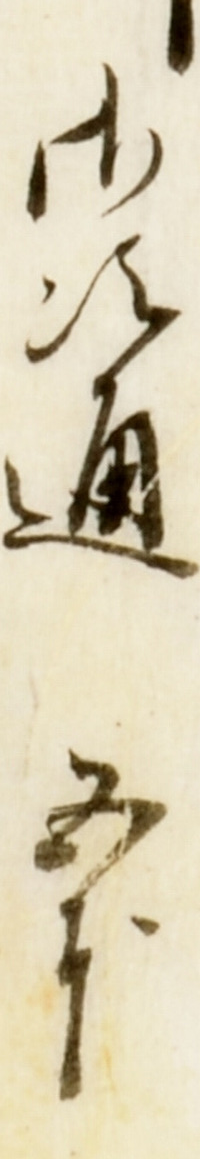御次通五本
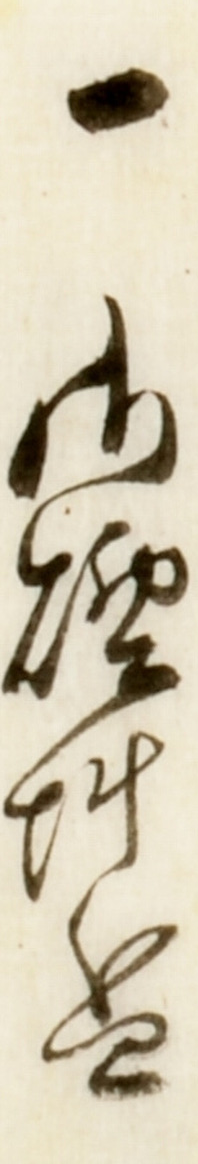一御煙草盆
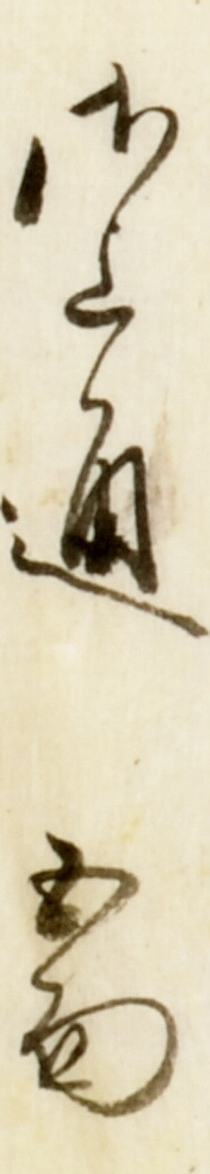御上通五面
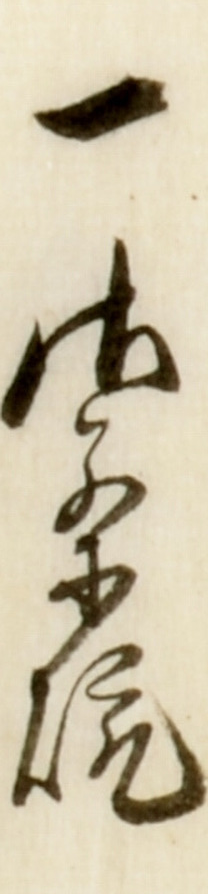一御茶碗

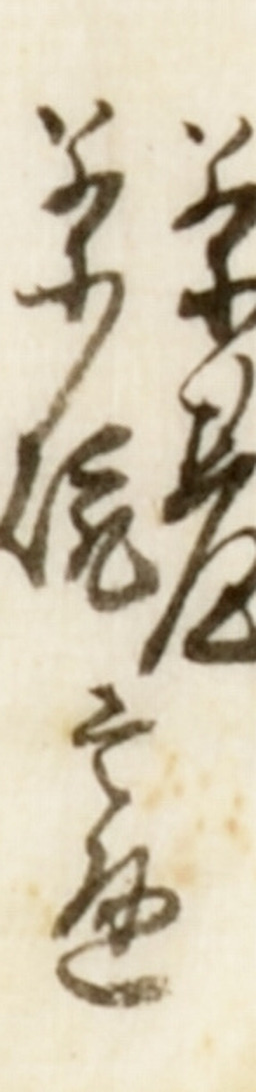茶碗壱通
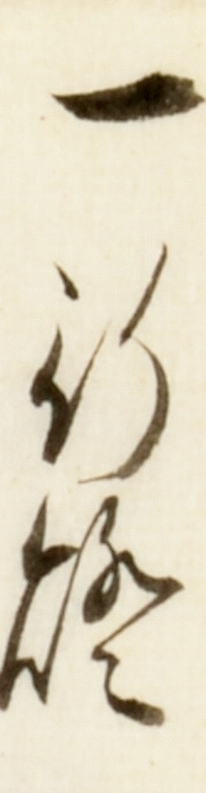一行燈
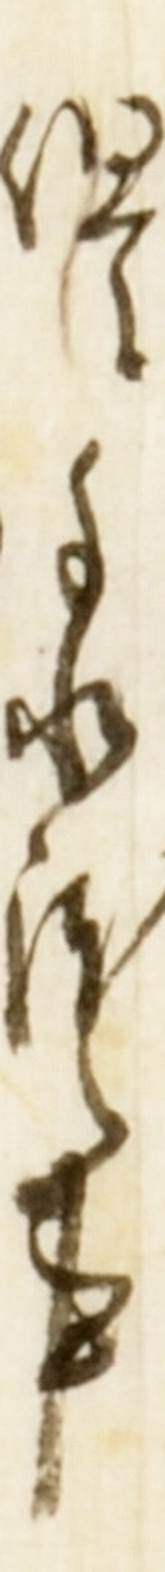但し手水鉢之事
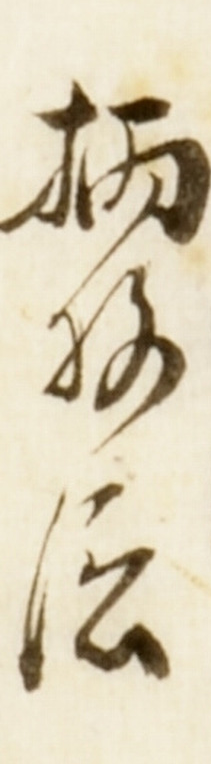柄杓添
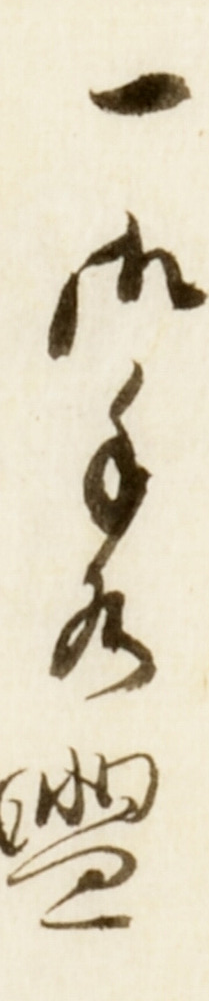一御手水盥
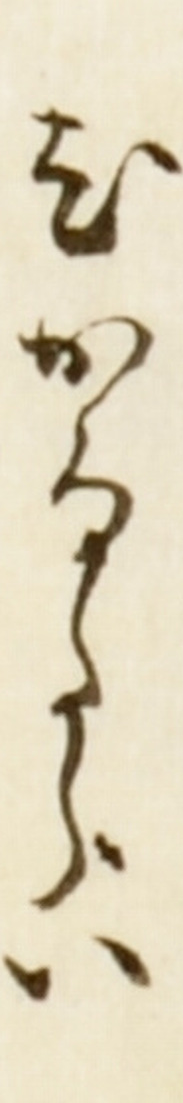尤かるたらい
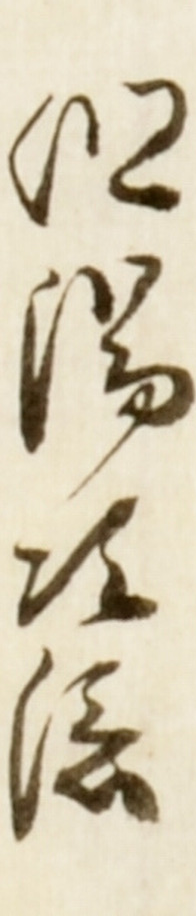但湯次添
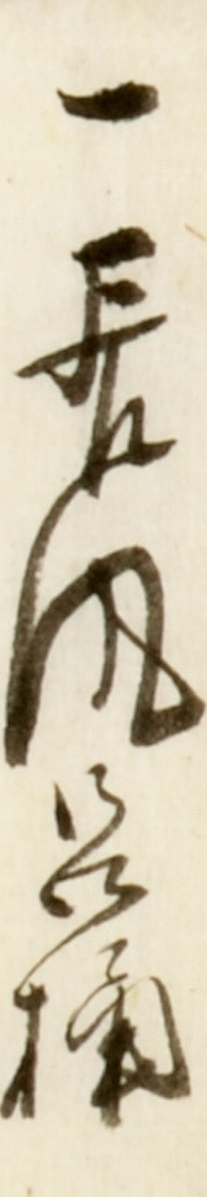一長風呂桶
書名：覚
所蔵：伊那市立高遠町図書館・合同会社AMANE
